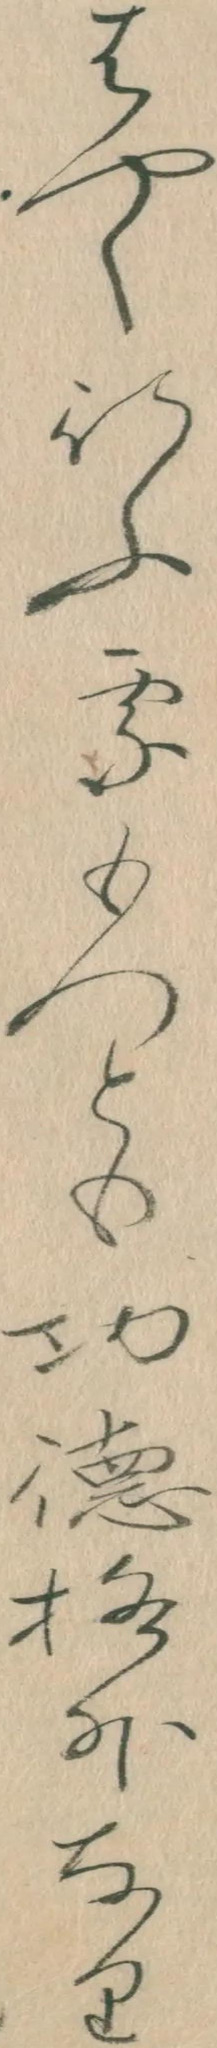はやく行ふ處もつとも功徳挌外なり
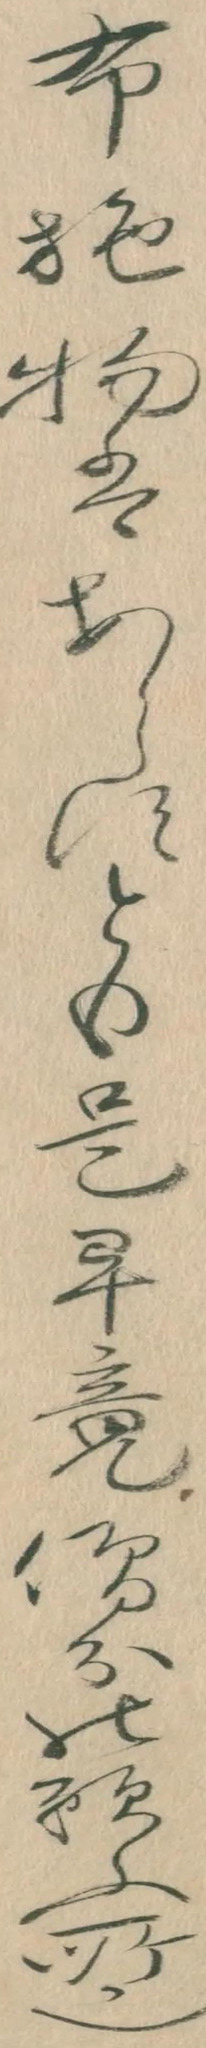布施物はあらすとも是畢竟僧分の願ふ所也

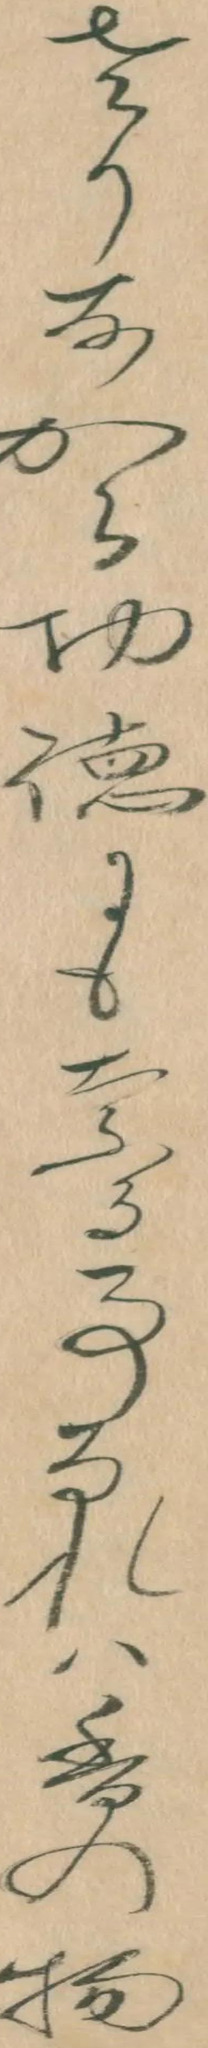さりなから功徳にもなる事なれは香の物
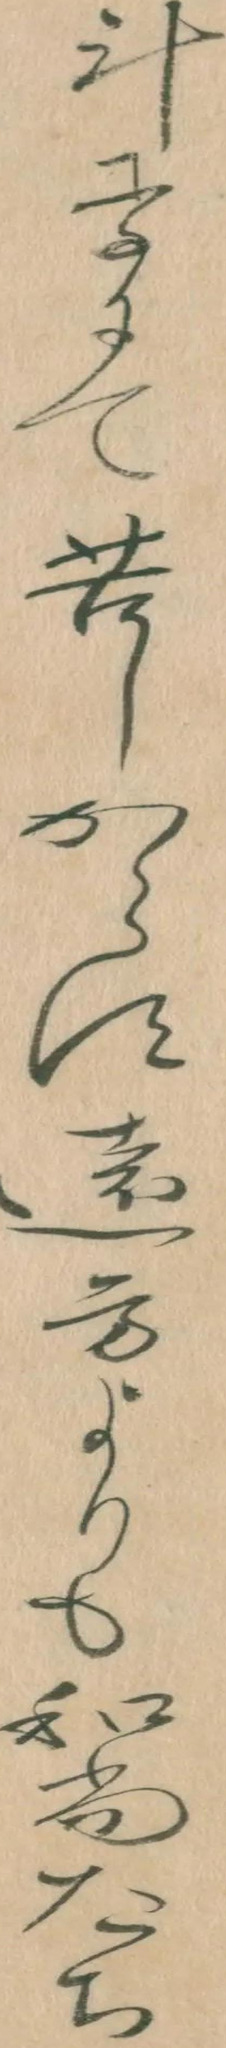斗りにて苦しからす遠方よりも和尚たち
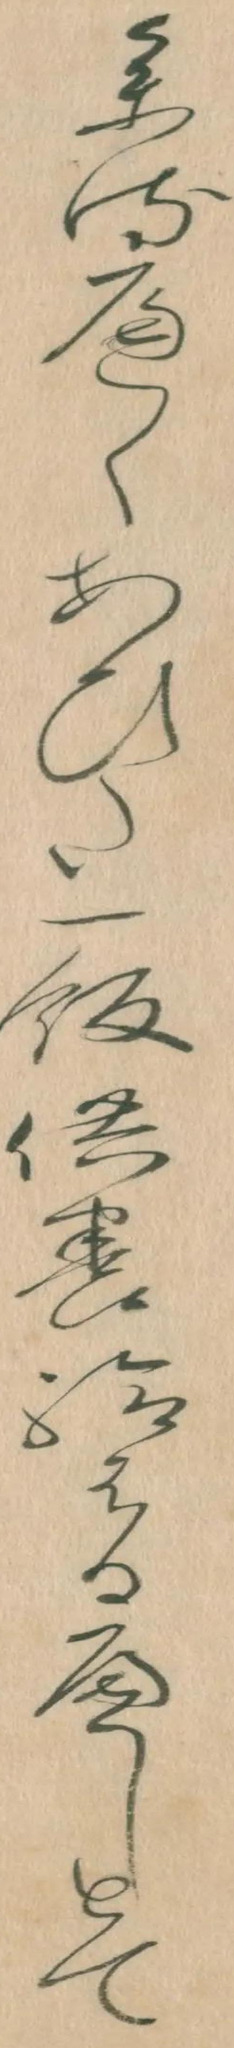参るへくあひた一飯供養給はるへしとて
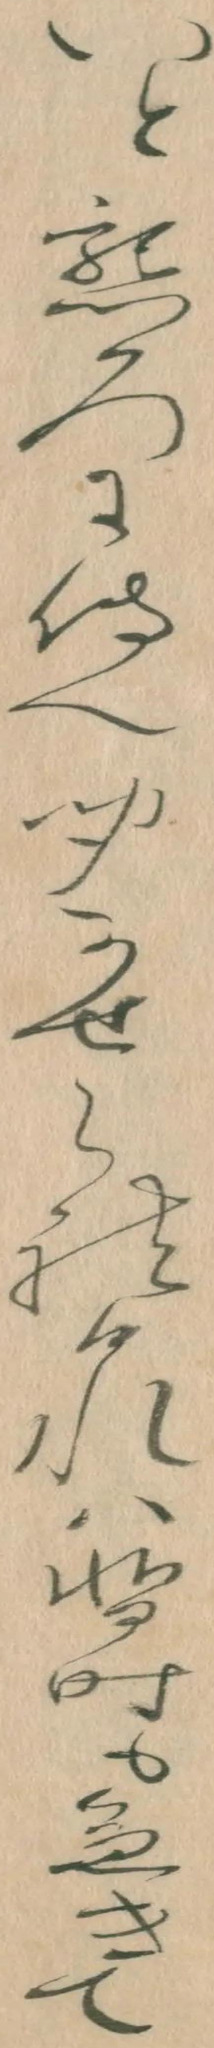いと懇ろに伝へ聞かせられけれは暫時も急きて
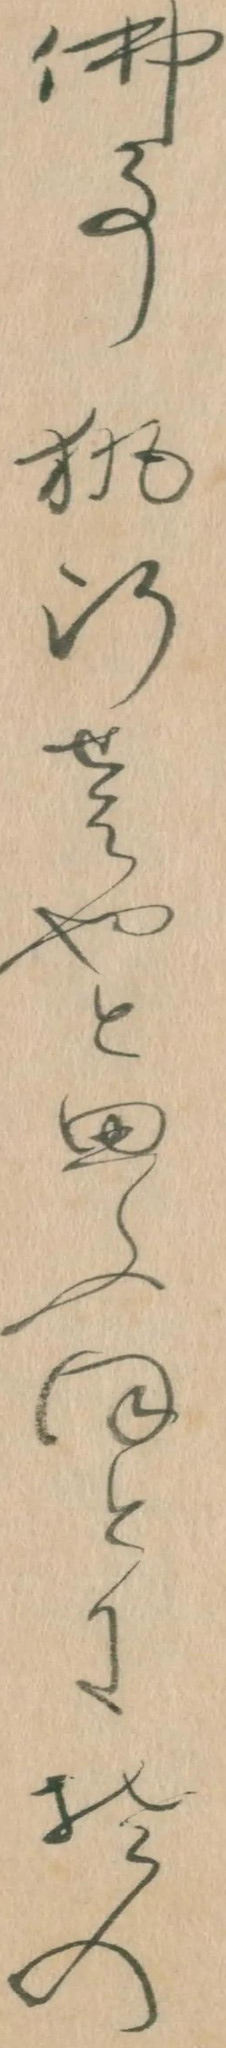仏事執行せすやと思ふほとにその
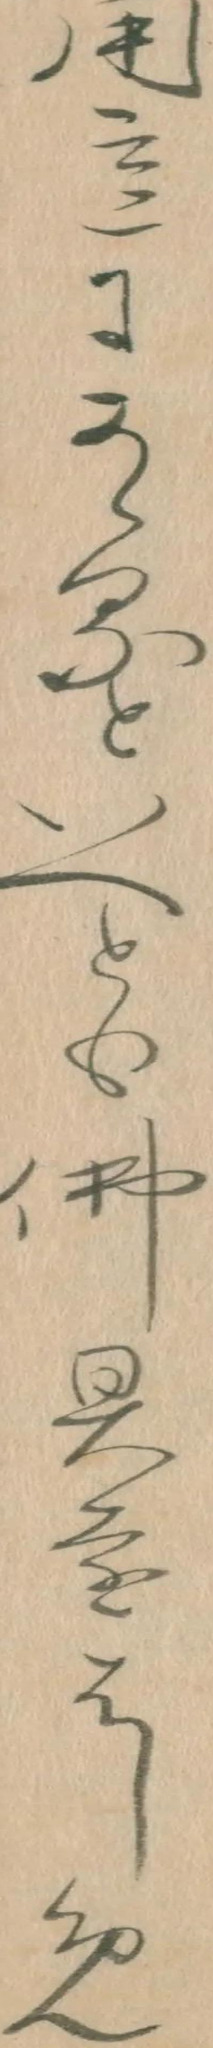用意にかゝるといへとも仏具をはしめ
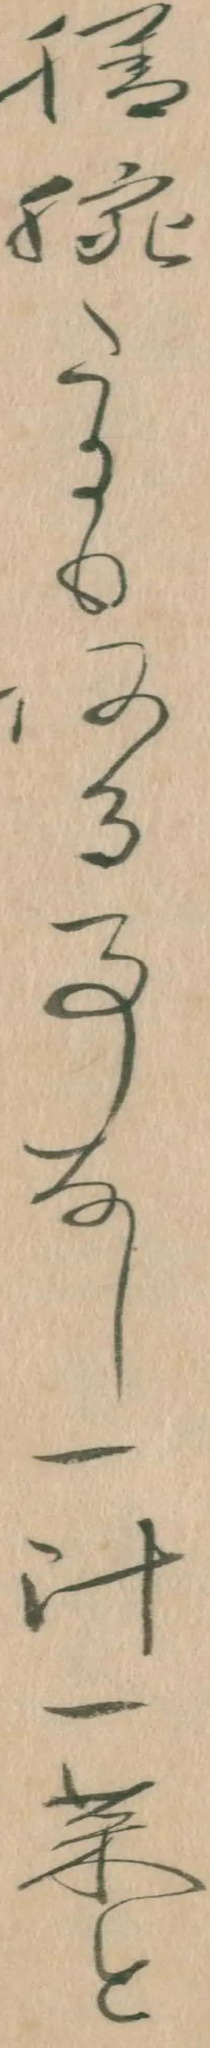膳椀たるもある事なし一汁一菜と
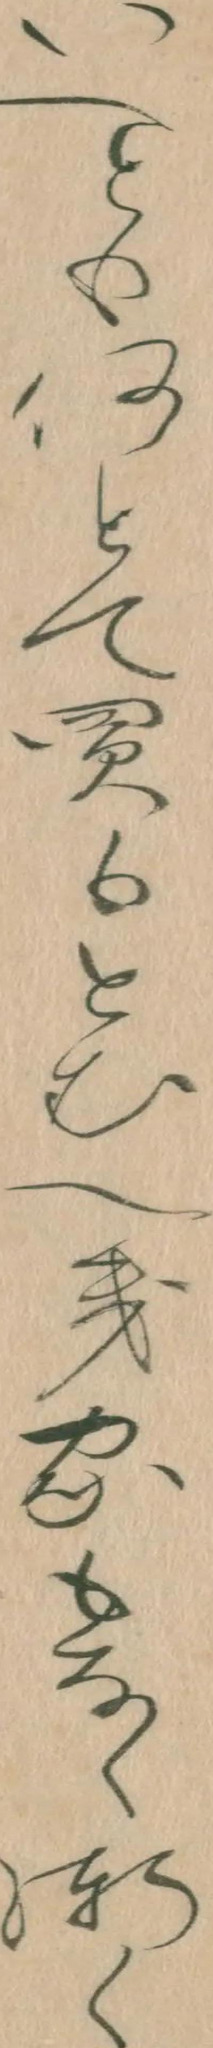いへとも何とて買もとむへき家もなく漸く
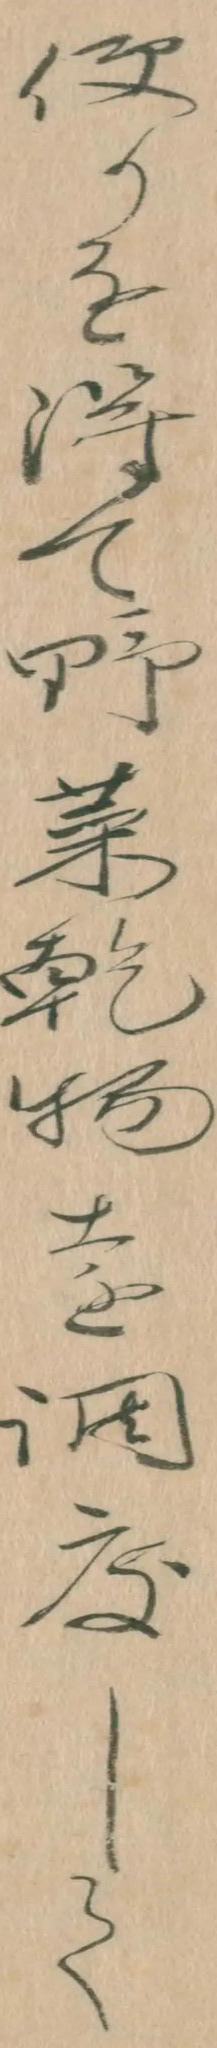便りを得て野菜乾物を調度して
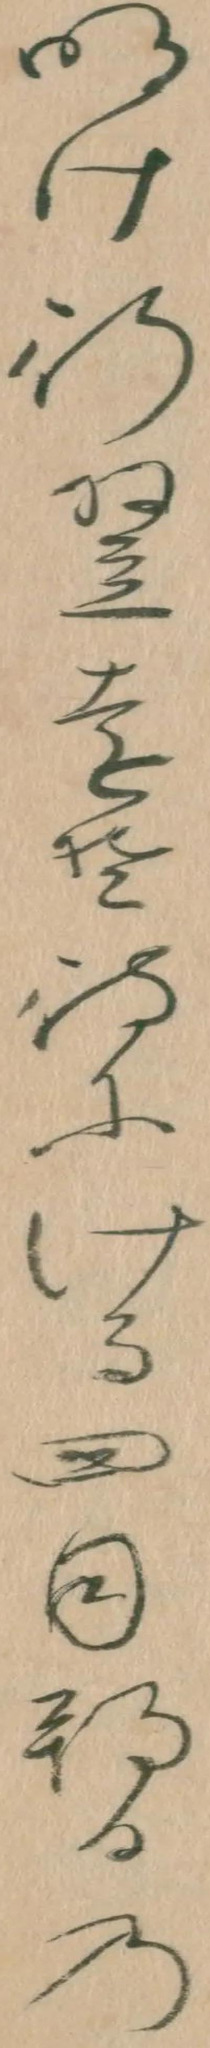明け行翌をそ待にける四月朔日の
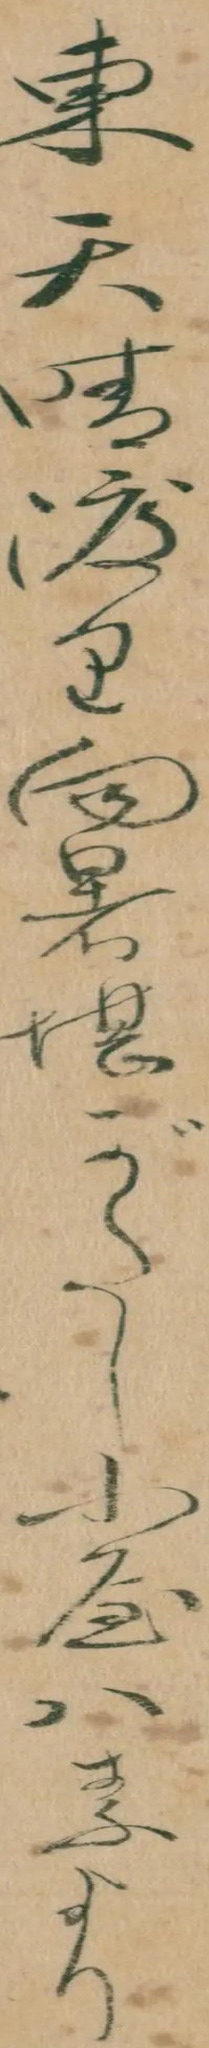東天晴渡り向暑堪がたく小屋は素より
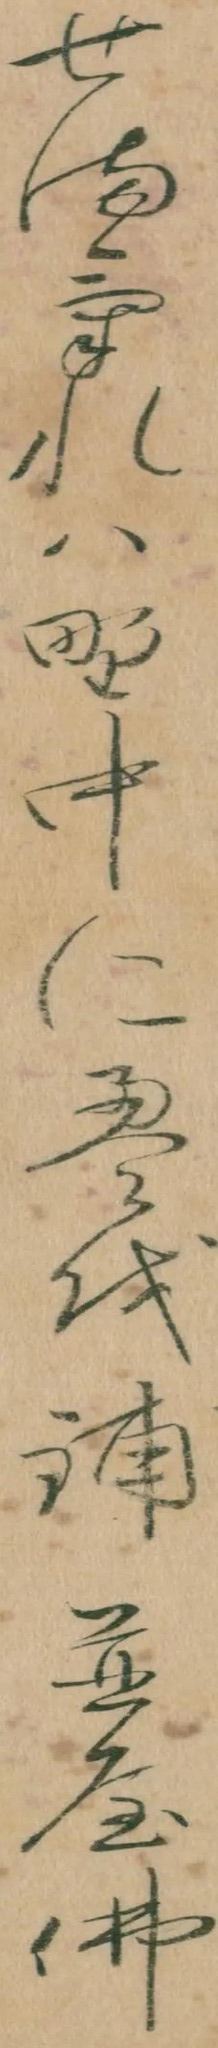せまけれは野中に畳を鋪並屋仏
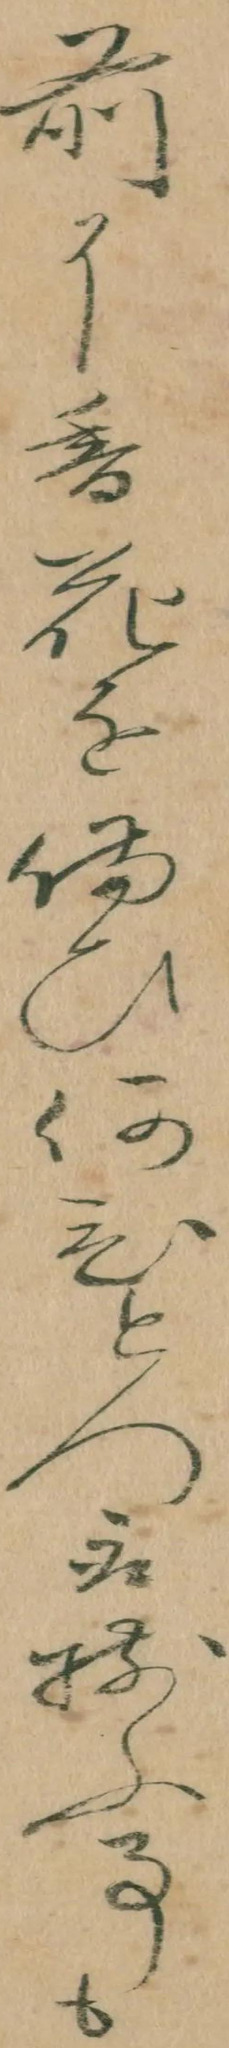前に香花を備ひ何ひとつ取揃ふ事も
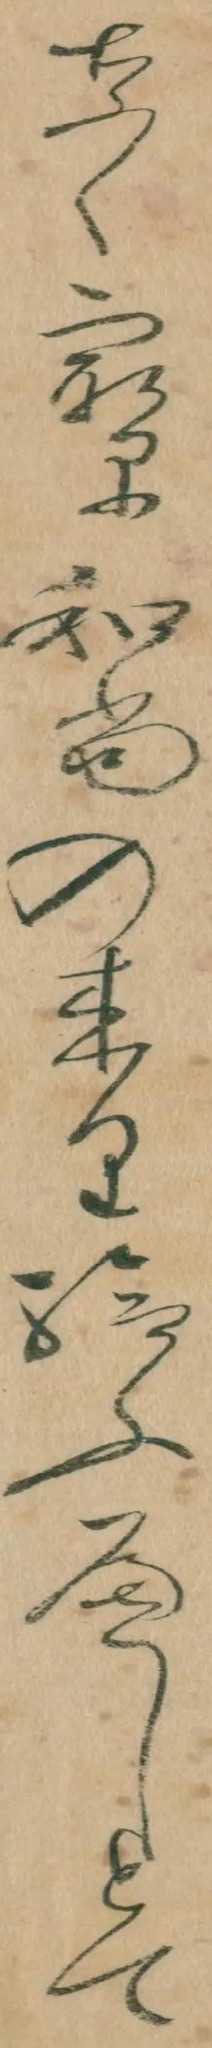なく最早和尚の来り給ふへしとて
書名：俗語之種. [5]
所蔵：国立国会図書館 National Diet Library, JAPAN
